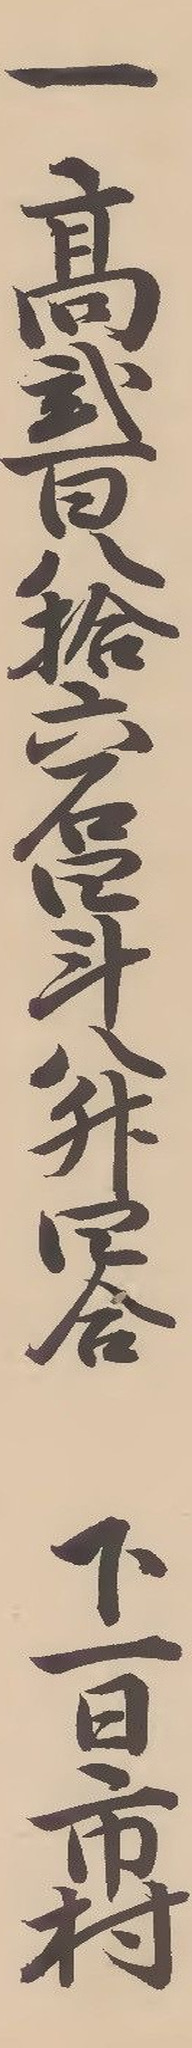一高弐百八拾六石四斗八升四合下一日市村

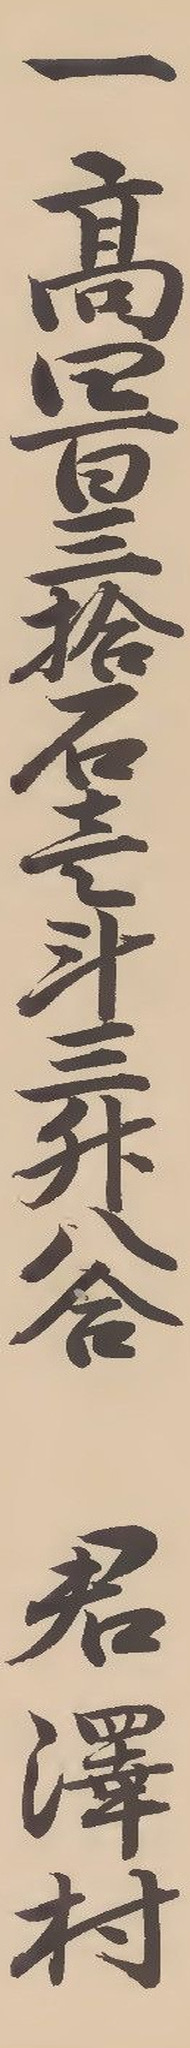一高四百三拾石壱斗三升八合君沢村
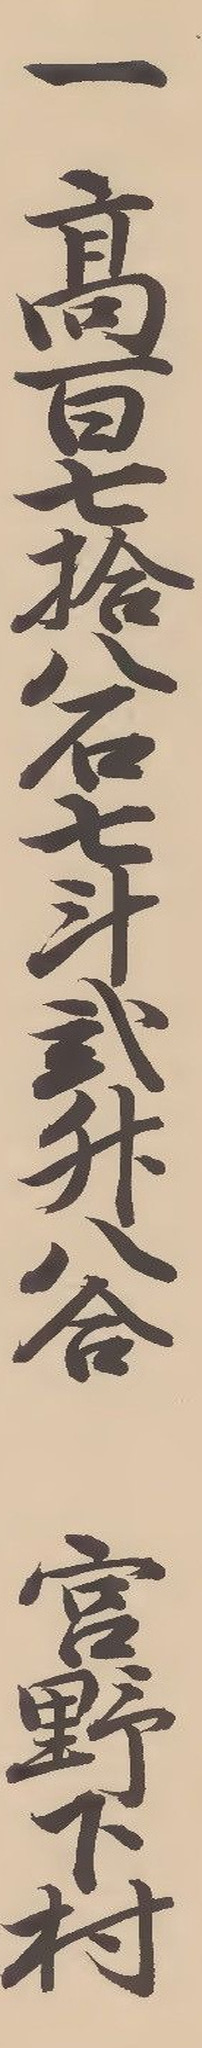一高百七拾八石七斗弐升八合宮野下村
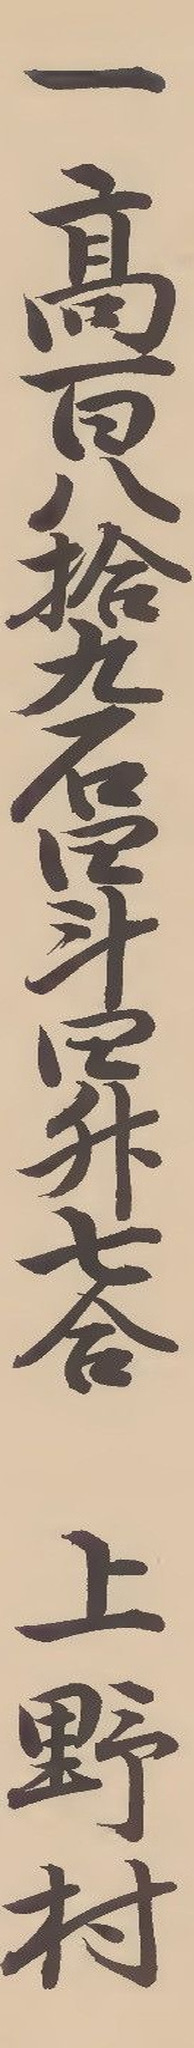一高百八拾九石四斗四升七合
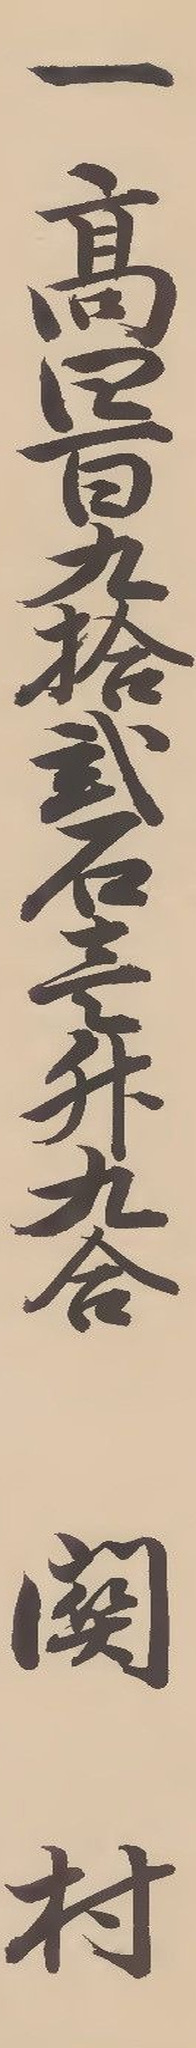一高四百九拾弐石壱升九合関村
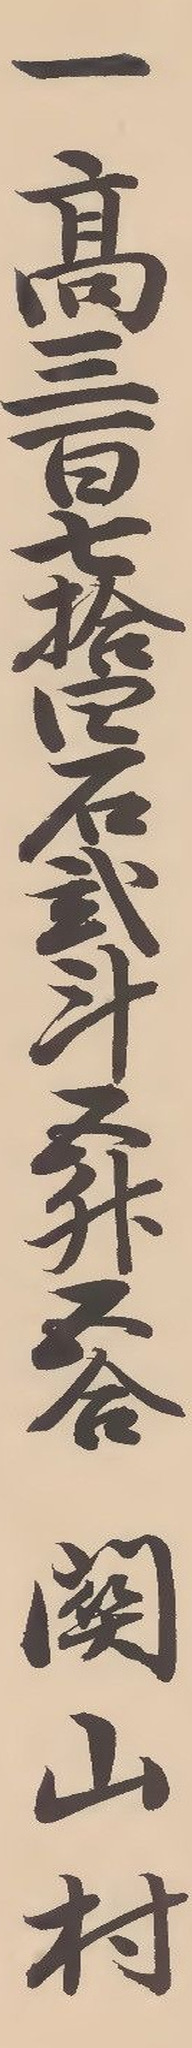一高三百七拾四石弐斗五升五合関山村
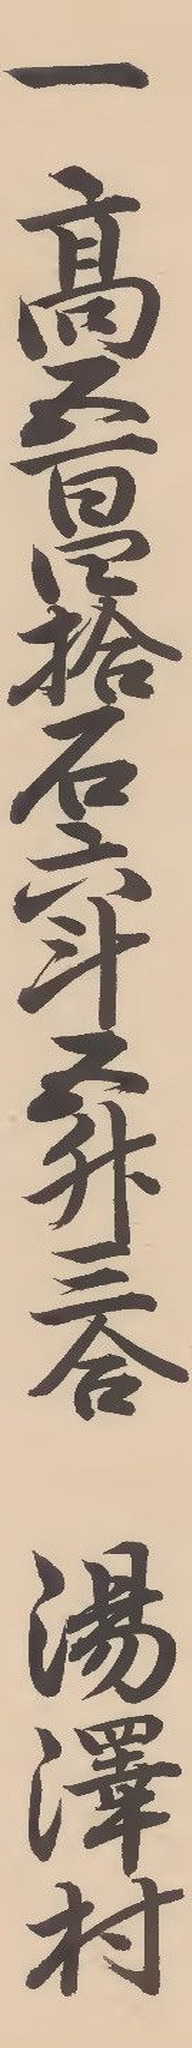一高五百四拾石六斗五升三合湯沢村
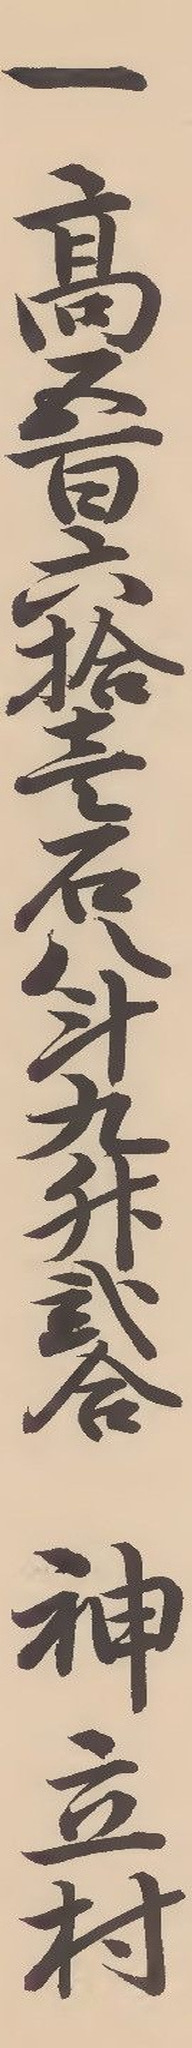一高五百六拾壱石八斗九升弐合神立村
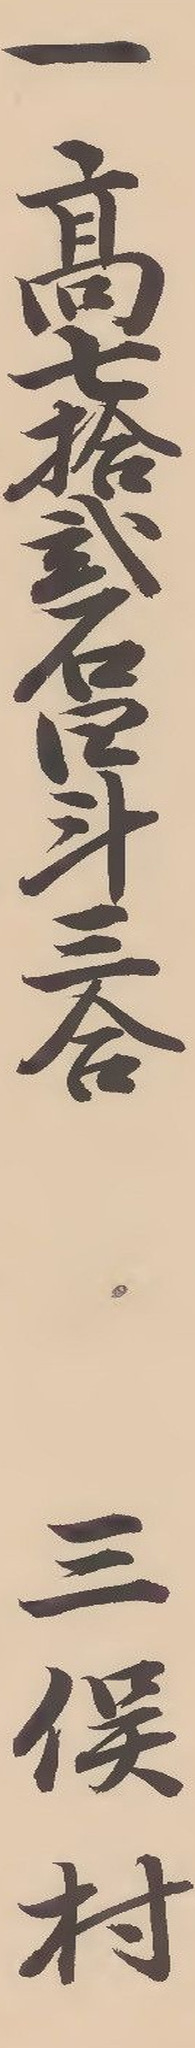一高七拾弐石四斗三合三俣村

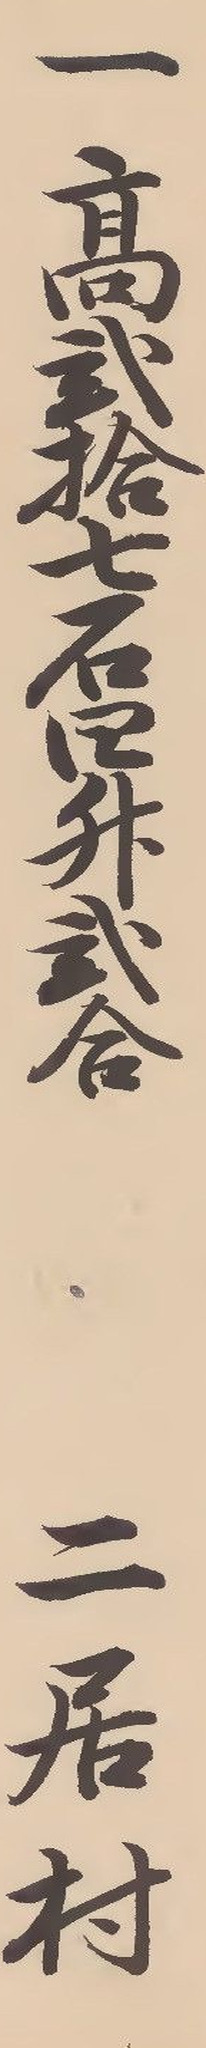一高弐拾七石四升弐合二居村
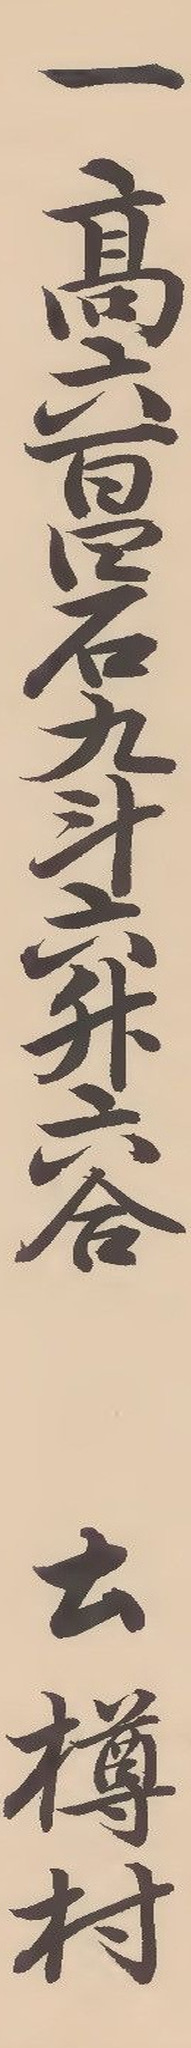一高六百四石九斗六升六合土樽村
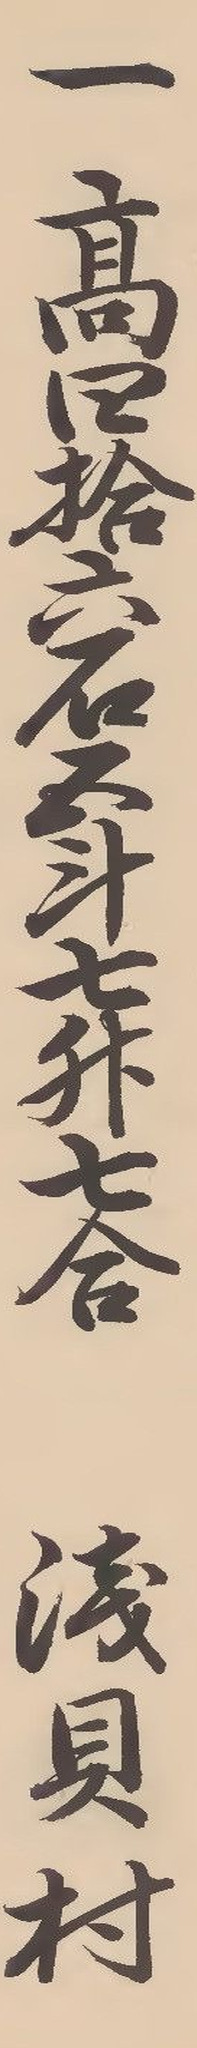一高四拾六石五斗七升七合浅貝村
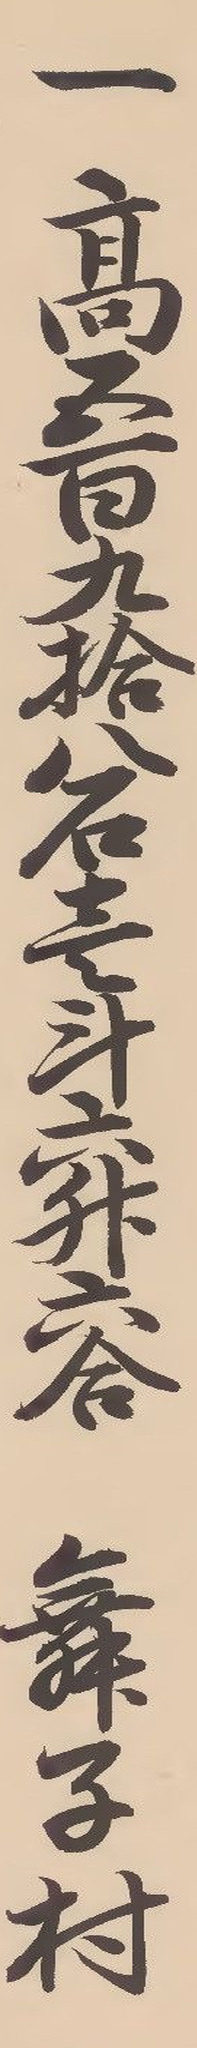一高五百九拾八石壱斗六升六合舞子村
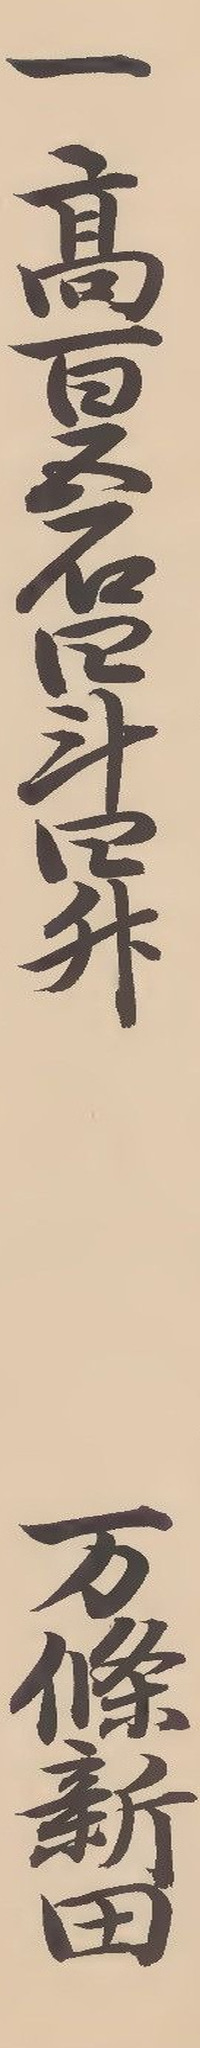一高百五石四斗四升万条新田
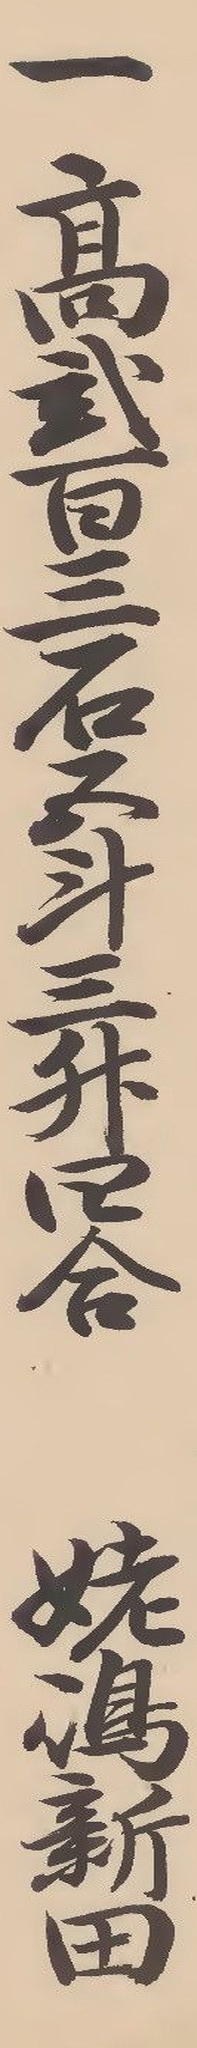一高弐百三石五斗三升四合姥島新田
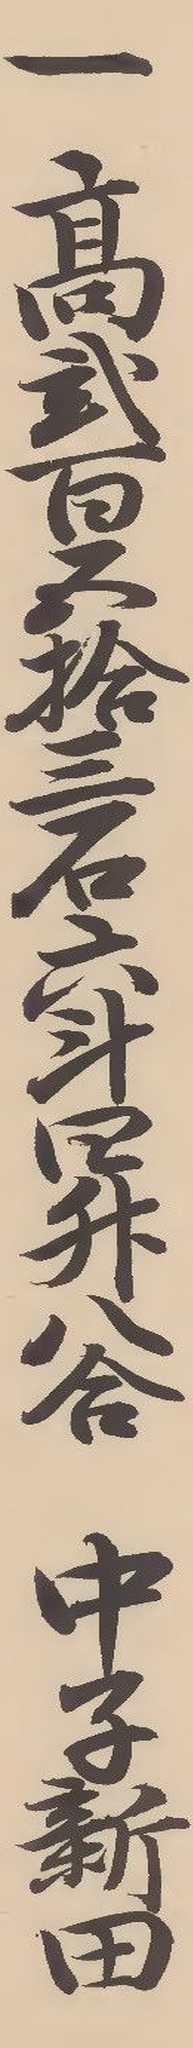一高弐百五拾三石六斗四升八合中子新田
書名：越後国郷帳　中
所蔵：国立公文書館 National Archives of Japan
